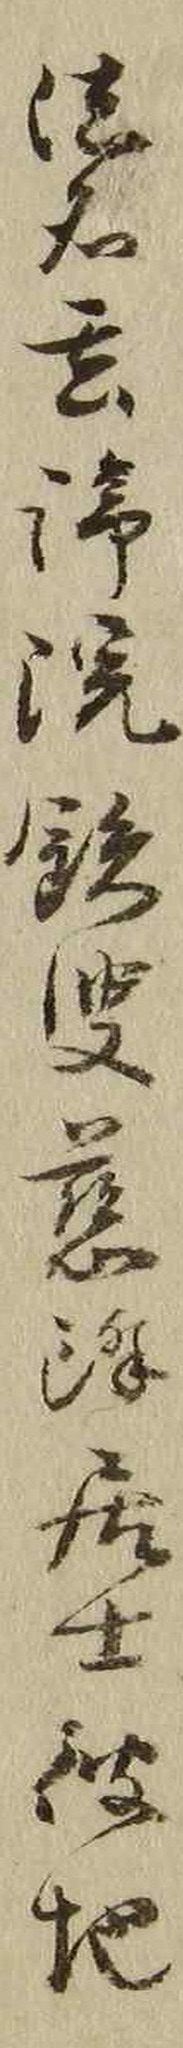法名玄諦院鉄叟慈降居士彼地
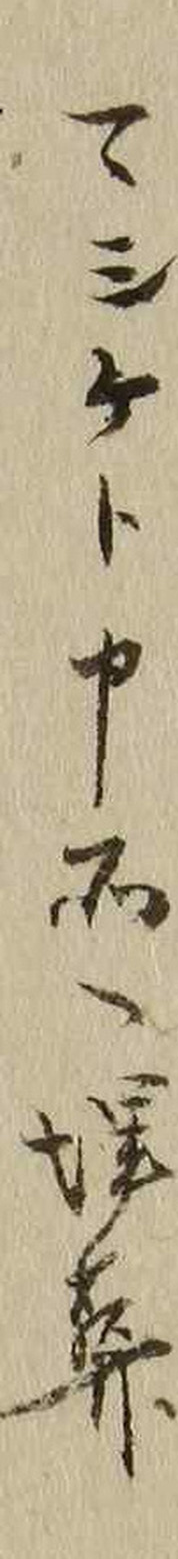マシケト申所へ埋葬
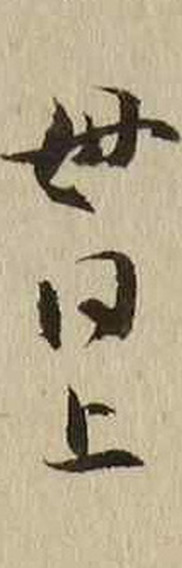母同上
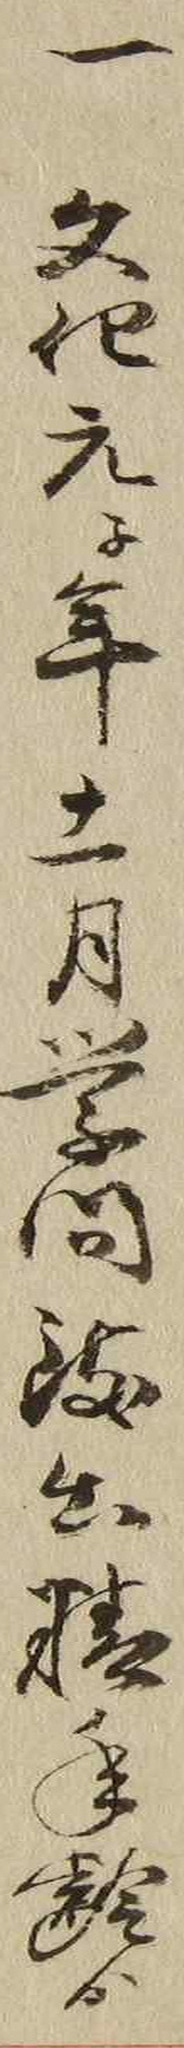一文化元子年十一月学問致出精年齢ゟ
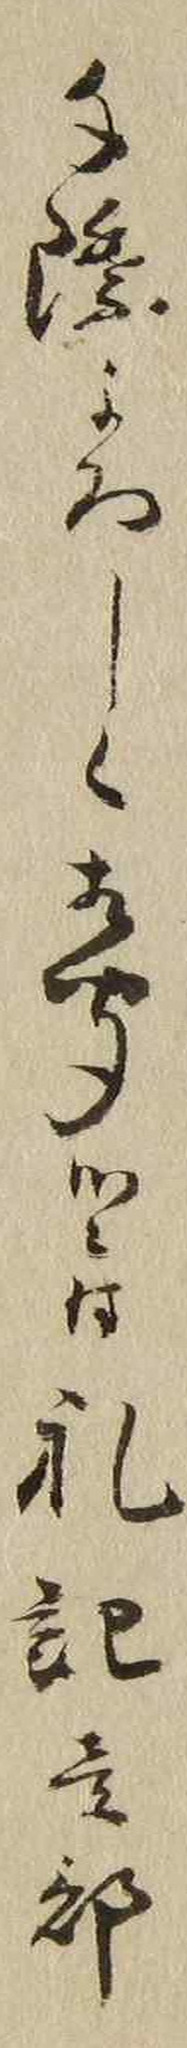手際よろしく相聞候ニ付礼記壱部
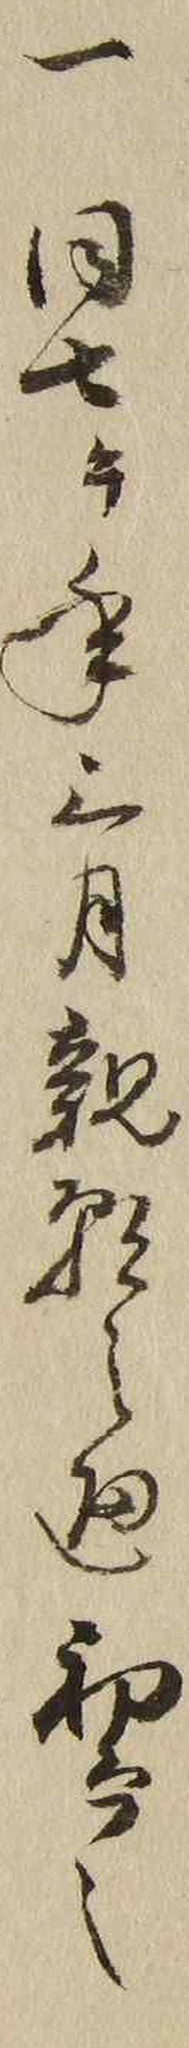一同七午年三月親願之通初而之
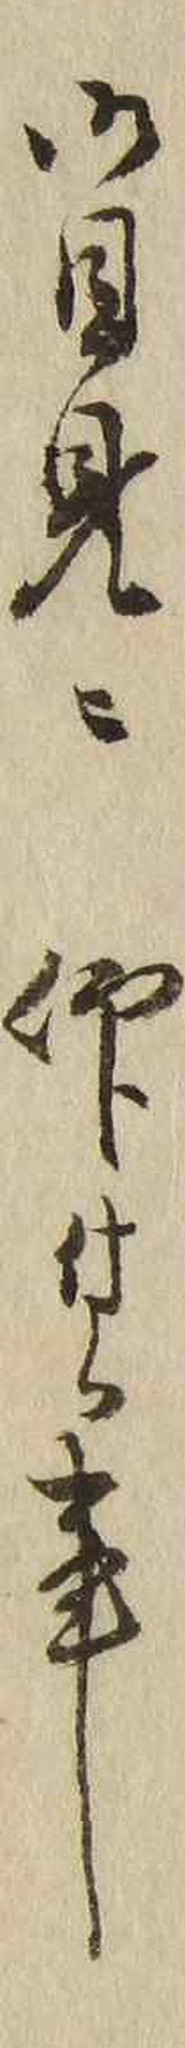御目見被仰付候事

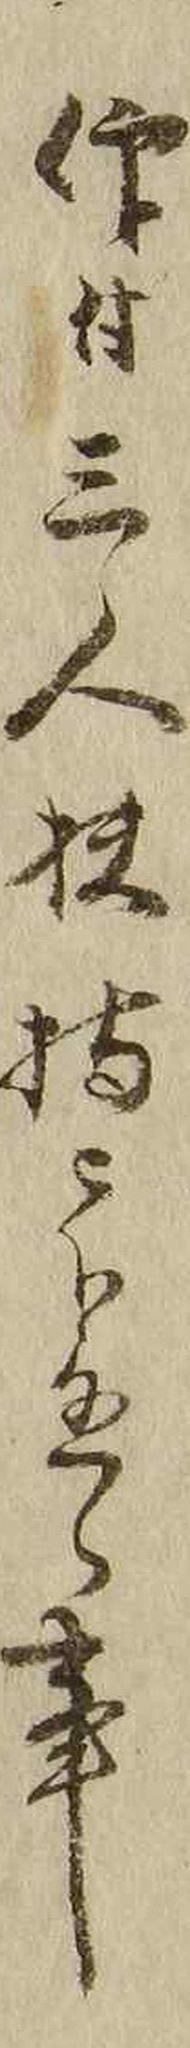仰付三人扶持被下置候事
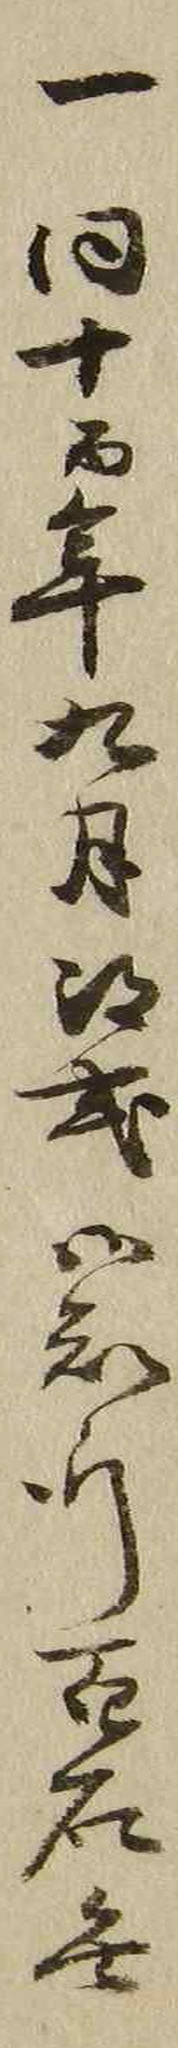一同十酉年九月跡式御知行百石無
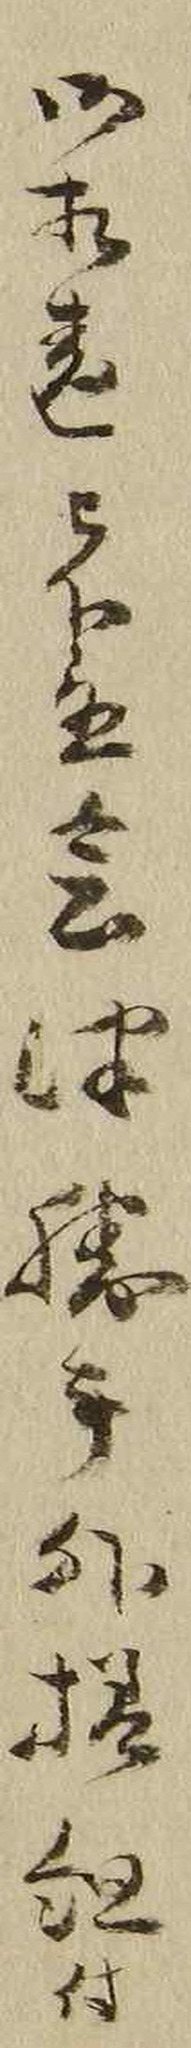御相違被下置会津勝年外様組付
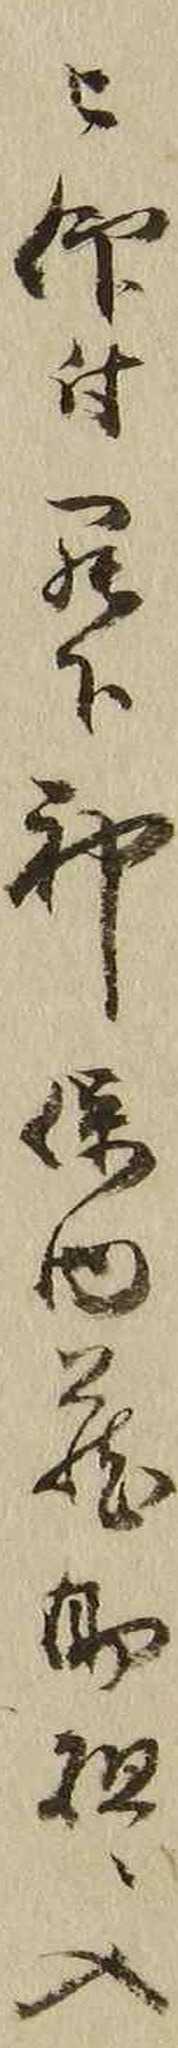被仰付罷下神保内蔵助組へ入
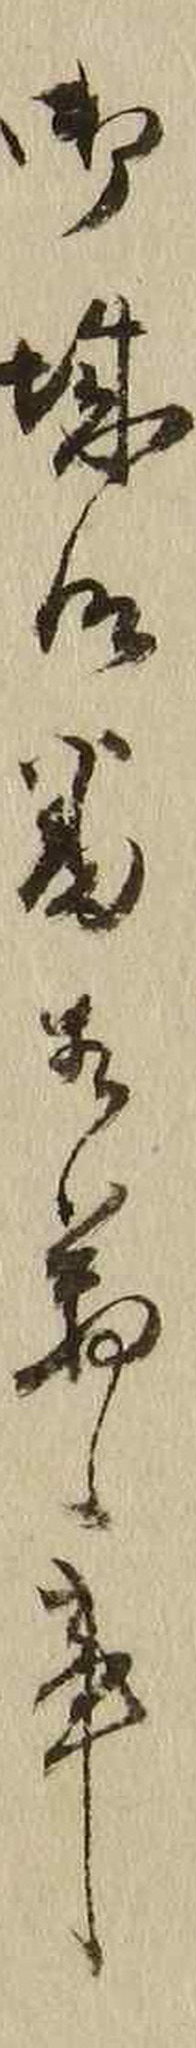御城御番相勤候事
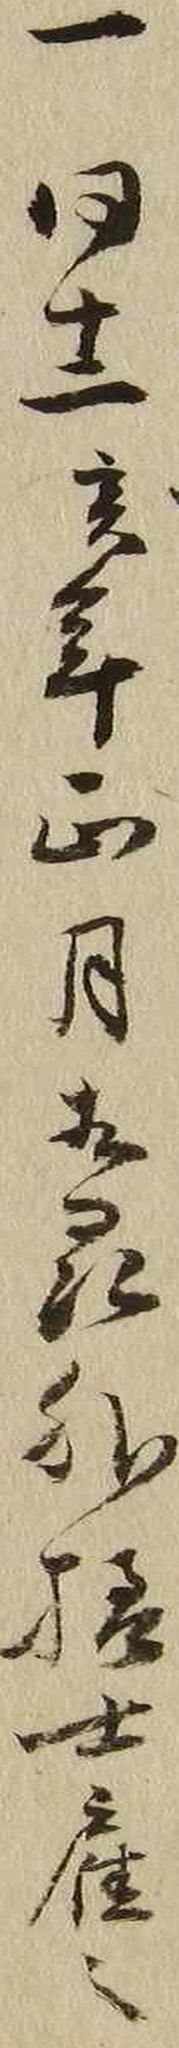一同十二亥年正月相州外様士雇之
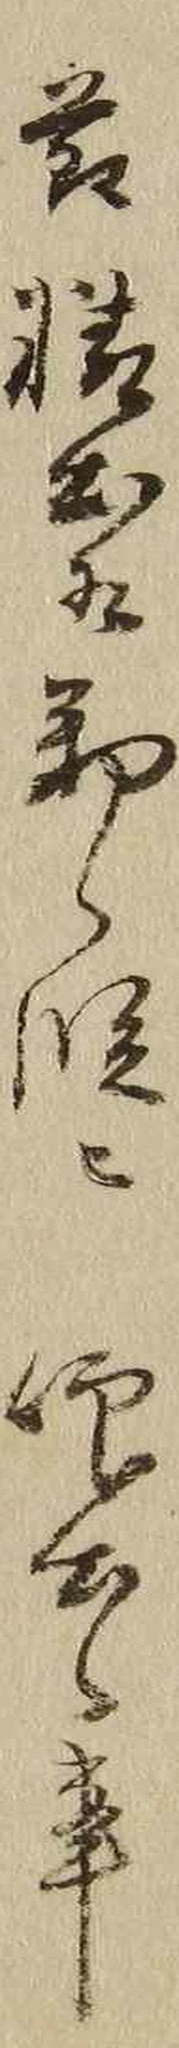節精出相勤候段被仰出候事
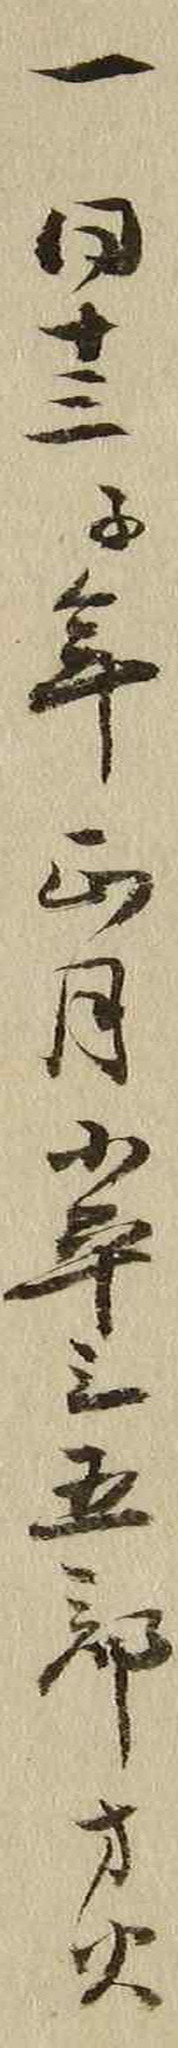一同十三子年正月小平三五郎方火
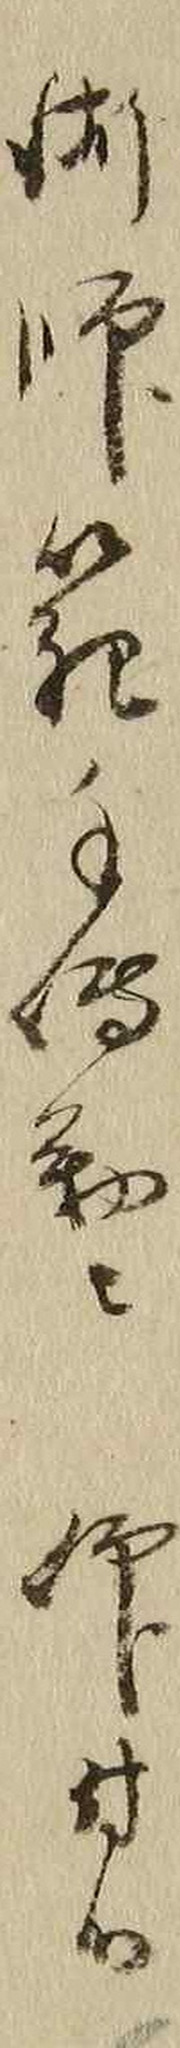術師範手伝勤被仰付候
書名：諸士系譜　巻之232　け之部1
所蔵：会津若松市立会津図書館
